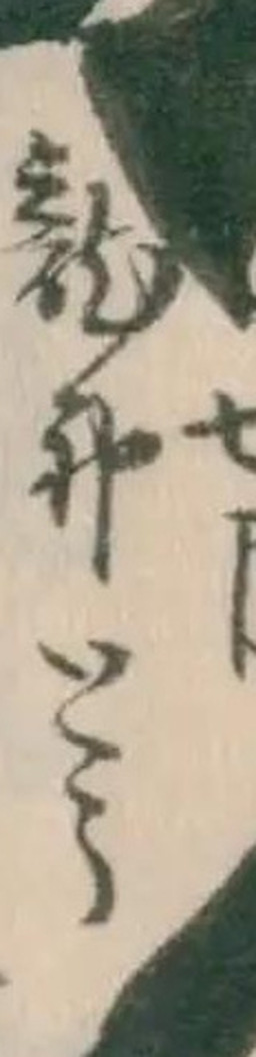龍神とう
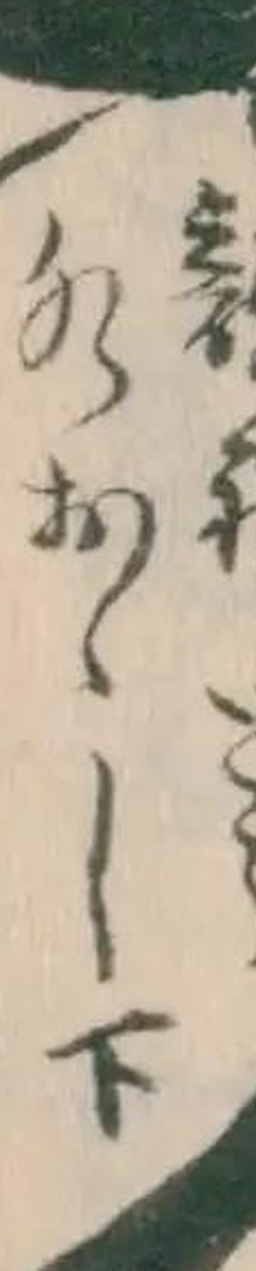水おゝし下
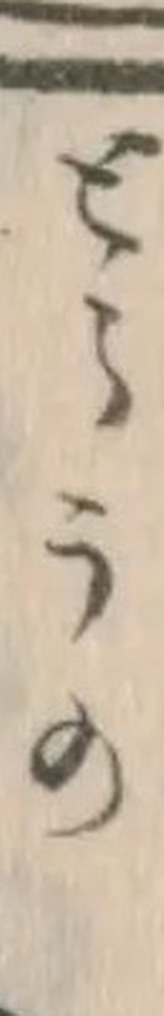とううの
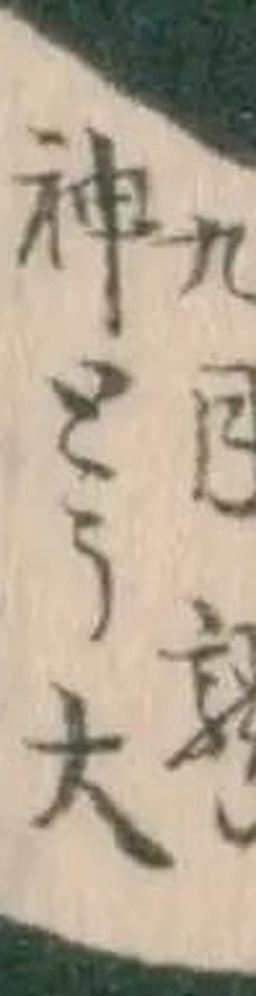神とう大
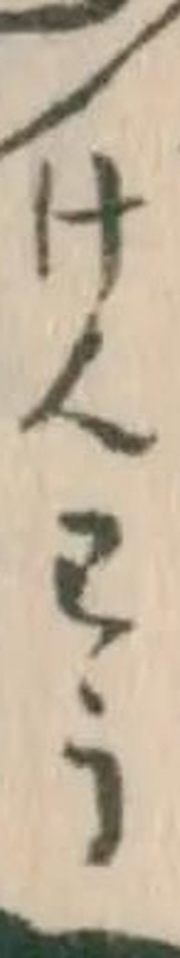けんわう
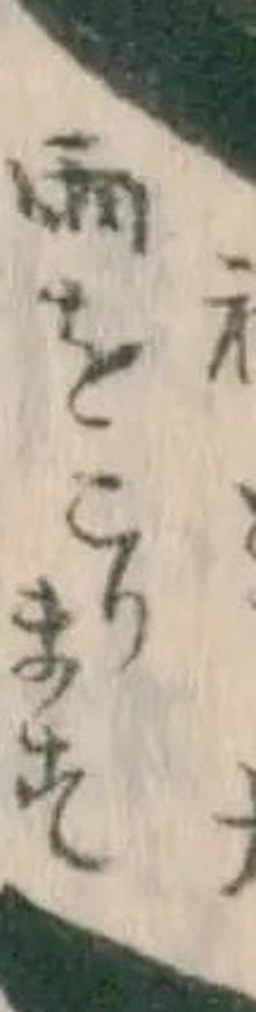雨をこります」
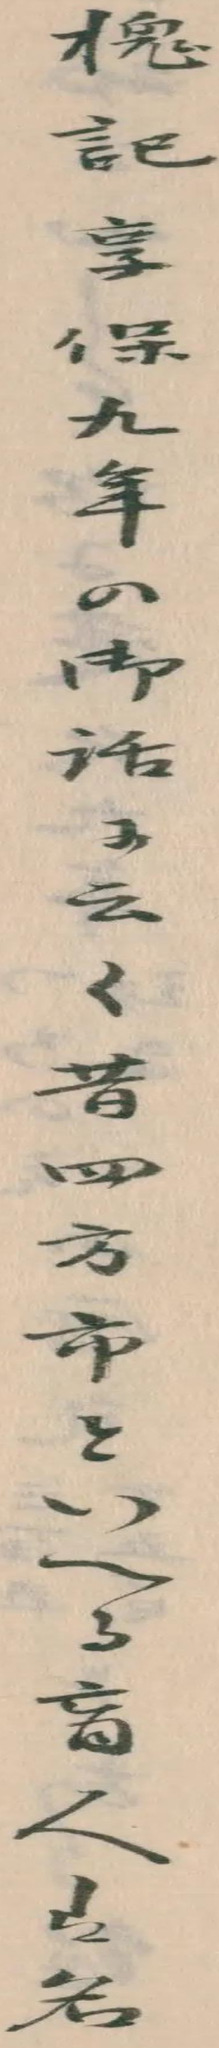槐記享保九年の御話に云く昔四方市といへる盲人は名
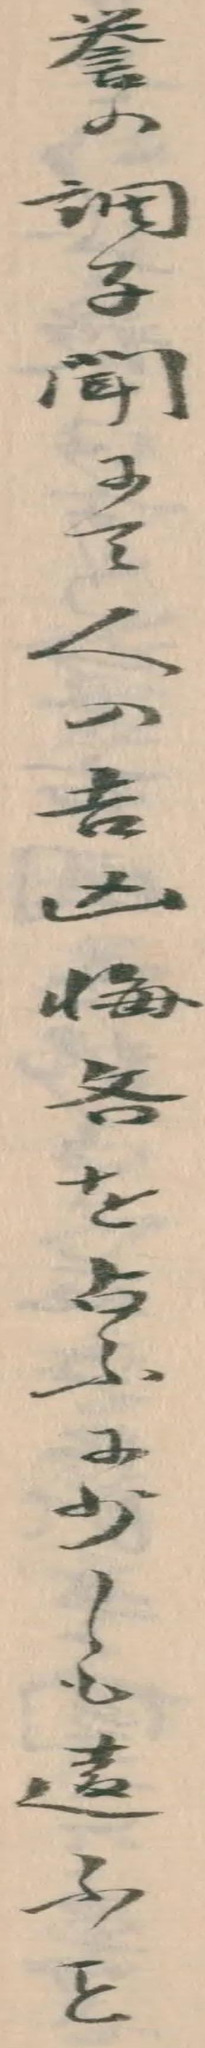誉の調子聞にて人の吉凶悔吝を占ふに少しも違ふこと
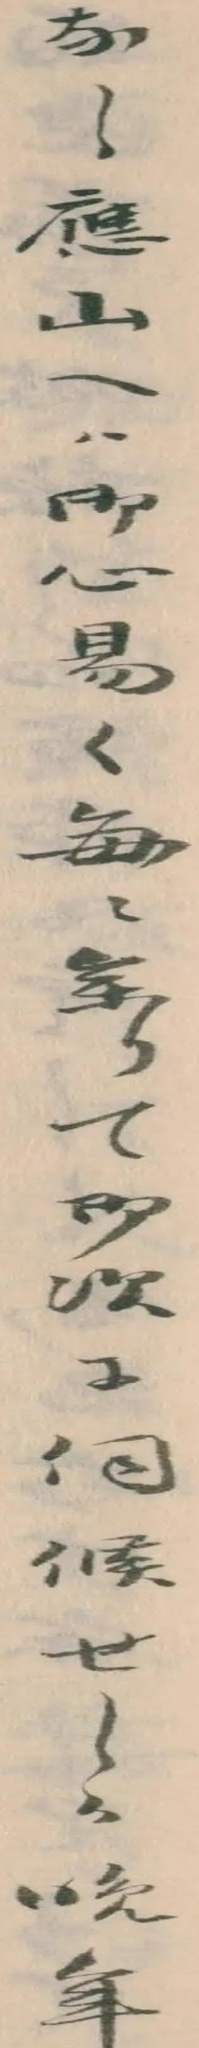なし応山へは御心易く毎々参りて御次に伺候せしか晩年
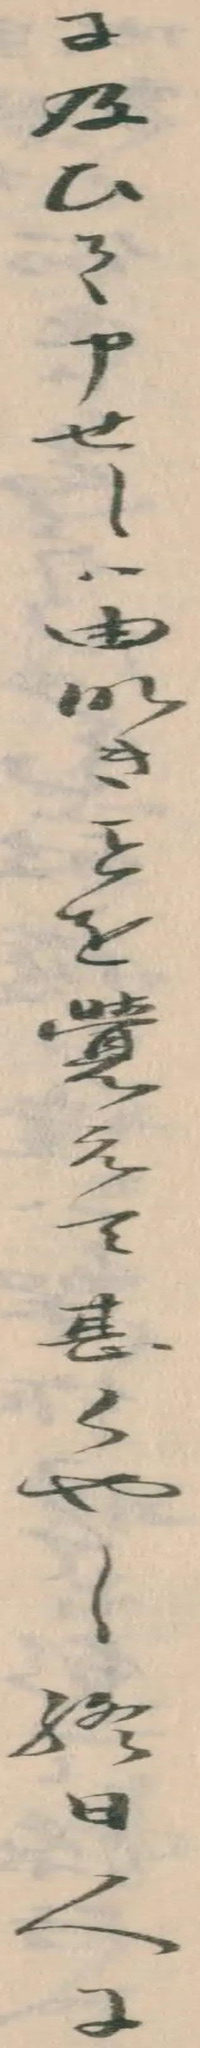に及ひて申せしは由なきことを覚えて甚くやし終日人に
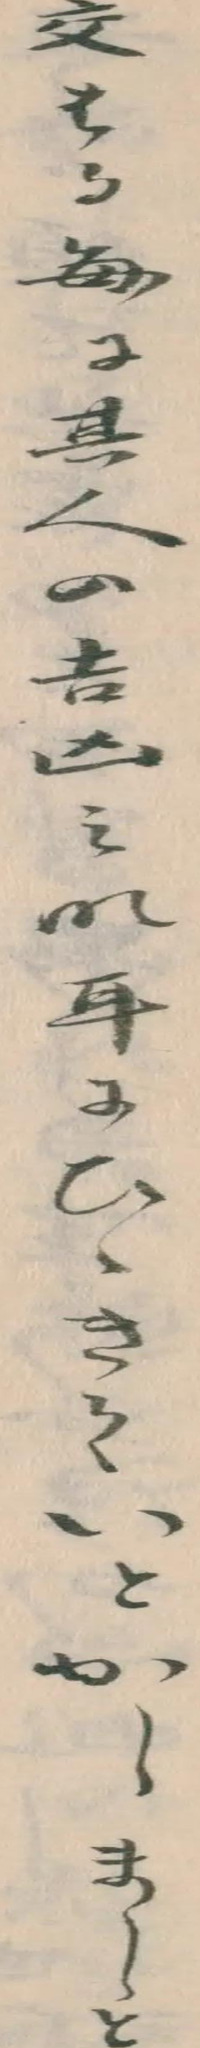交はる毎に其人の吉凶みな耳にひゝきていとかしましと
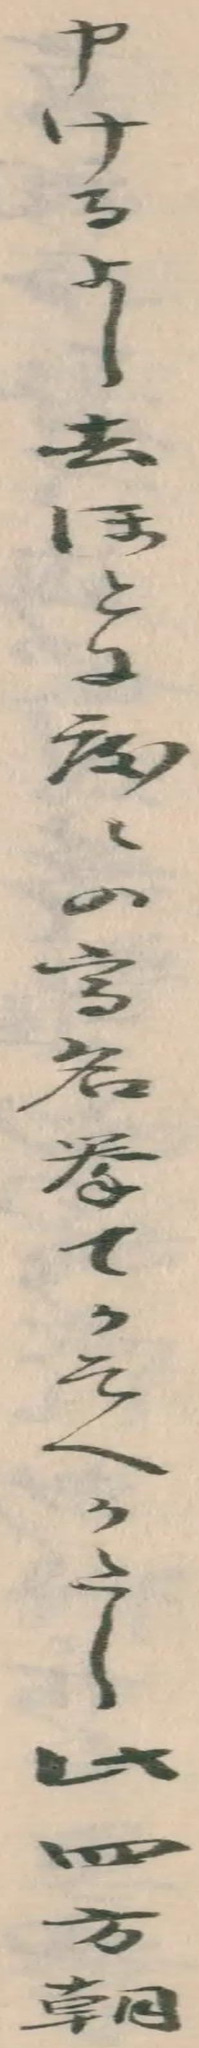申けるよし去ほとに度々の高名挙てかそへかたし此四方朝
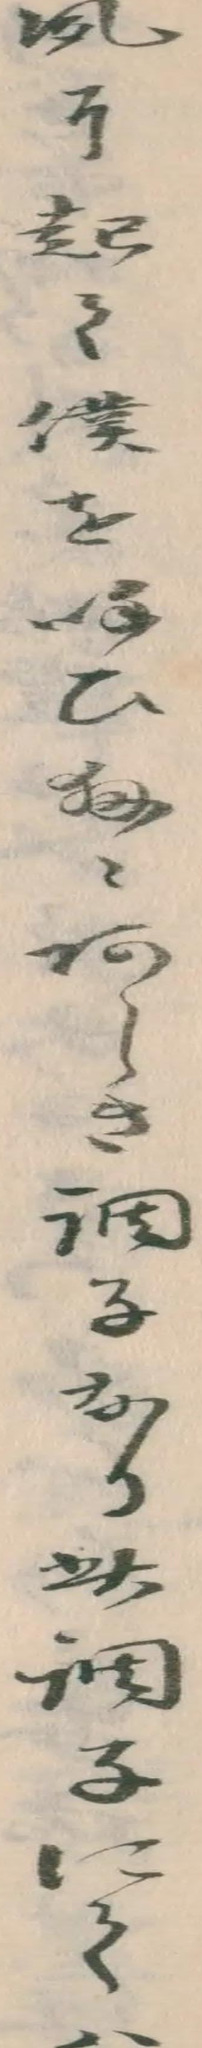夙に起て僕を呼ひ扨々あしき調子なり此調子にては
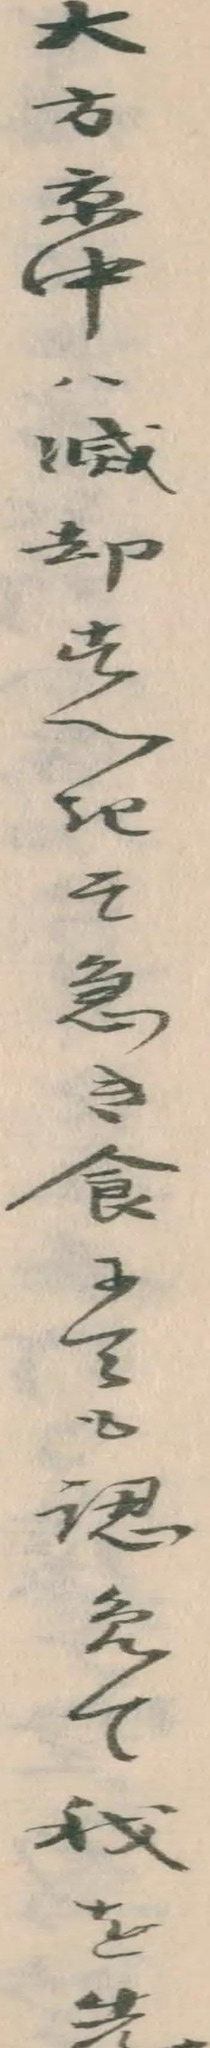大方京中は滅却すへきそ急き食にても認めて我を先
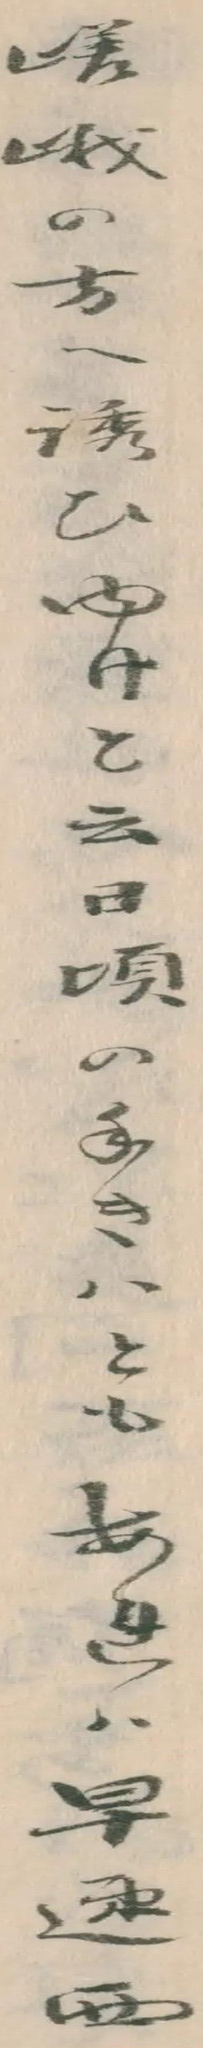嵯峨の方へ誘ひゆけと云日頃の手きはともあれは早速西
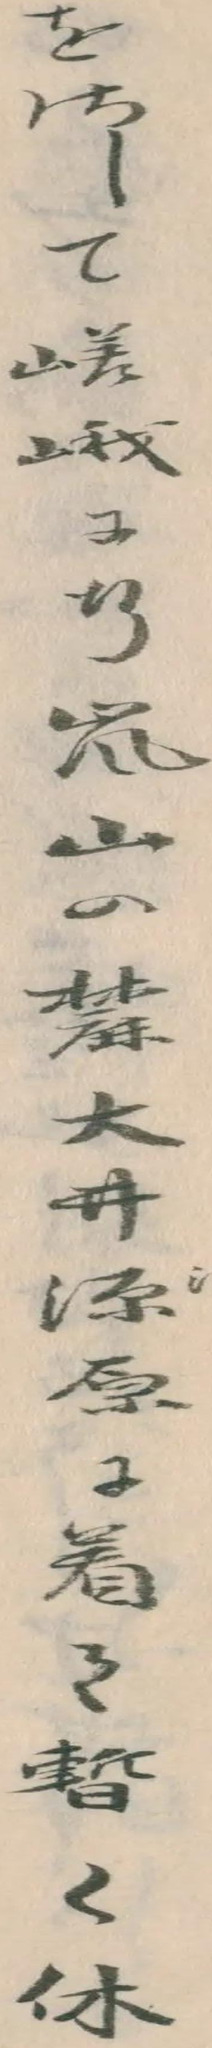をさして嵯峨に行嵐山の麓大井源原に着て暫く休
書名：地災撮要. 巻11-12(地震之部)
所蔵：国立国会図書館 National Diet Library, JAPAN
